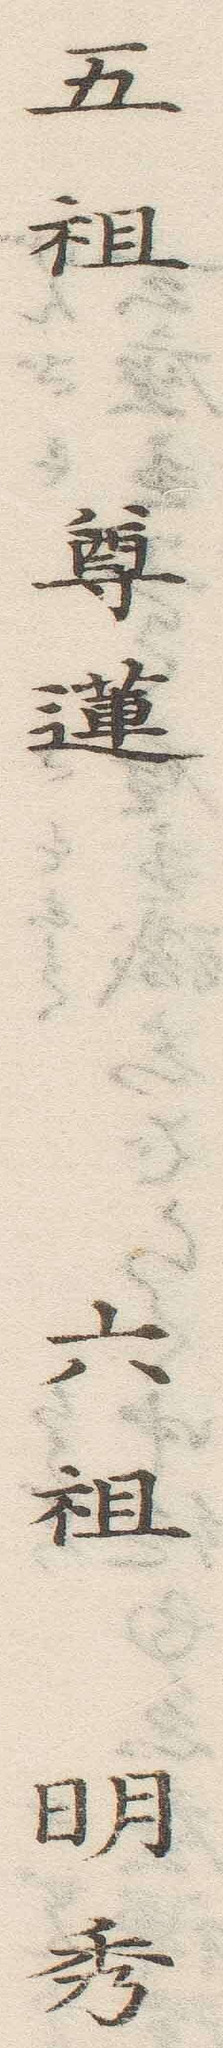五祖尊蓮六祖明秀
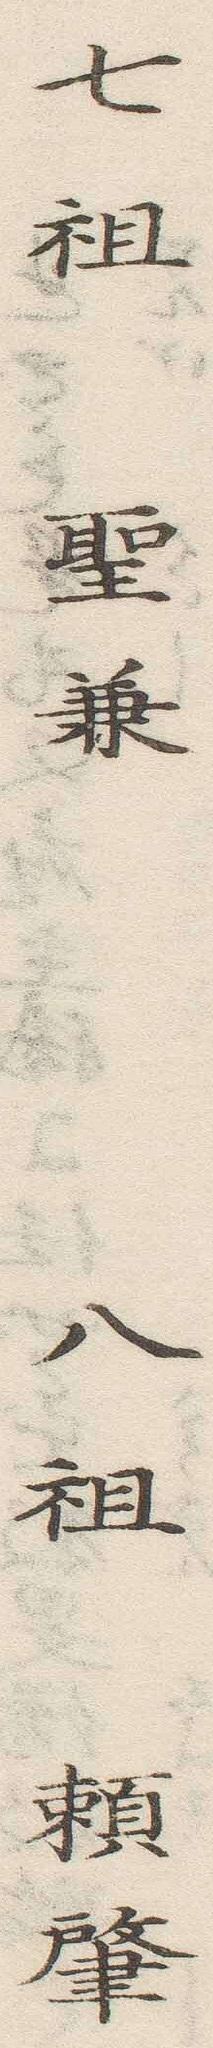七祖聖兼八祖頼肇
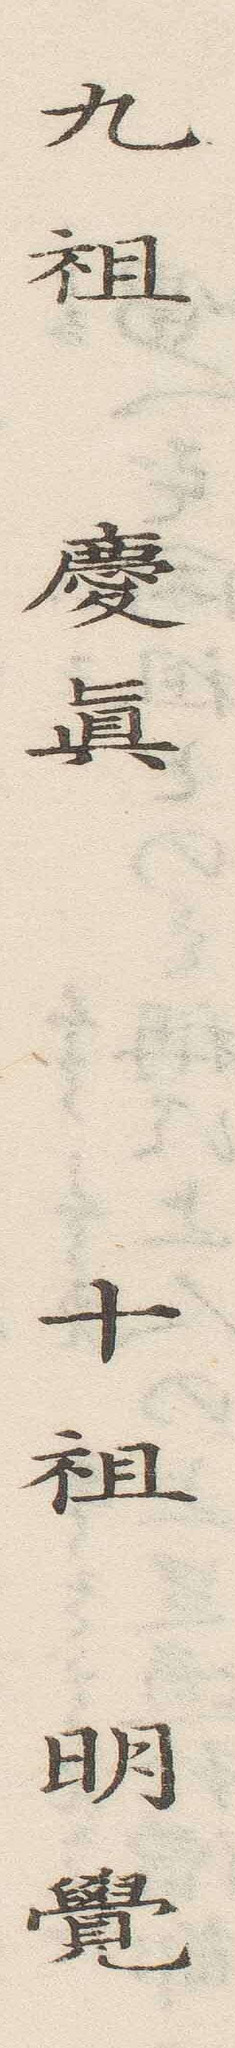九祖慶眞十祖明覺
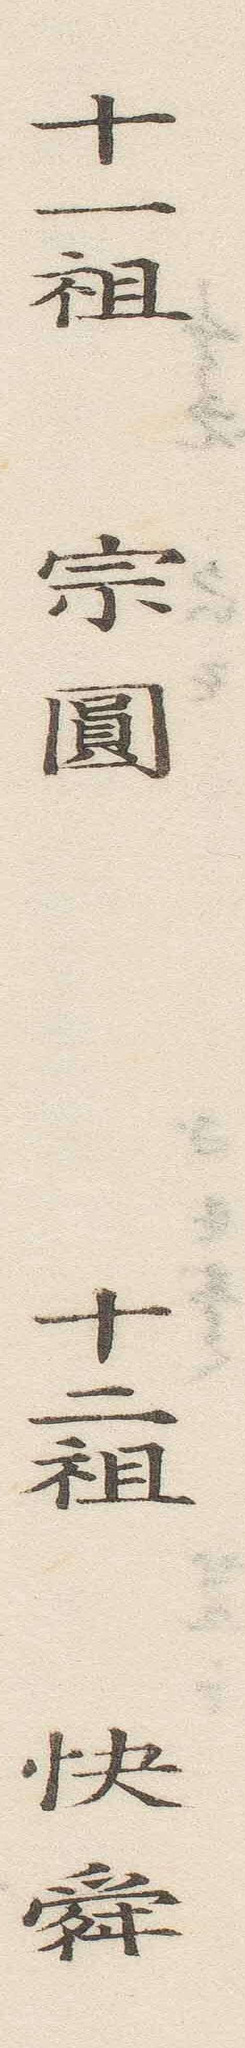十一祖宗圓十二祖快舜
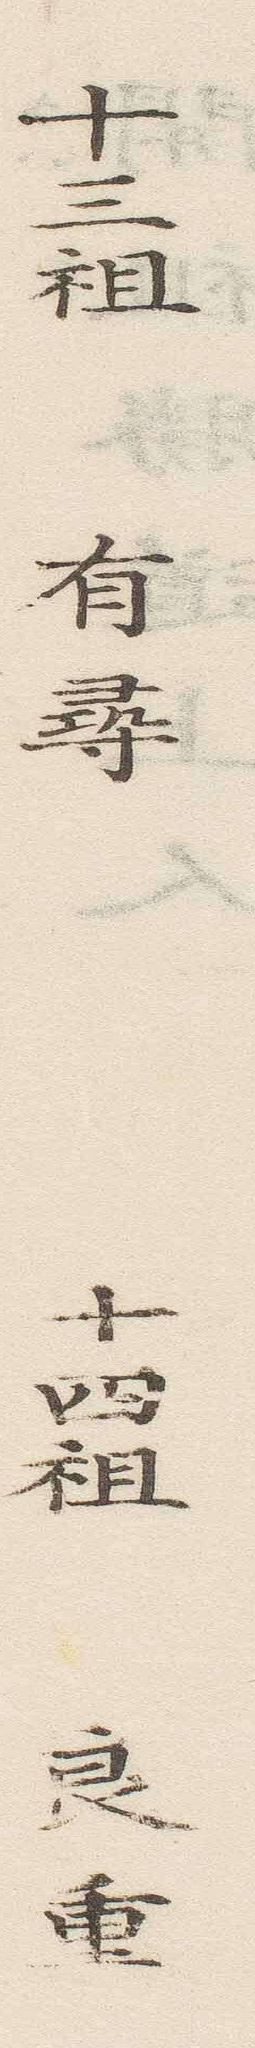十三祖有尋十四祖良重
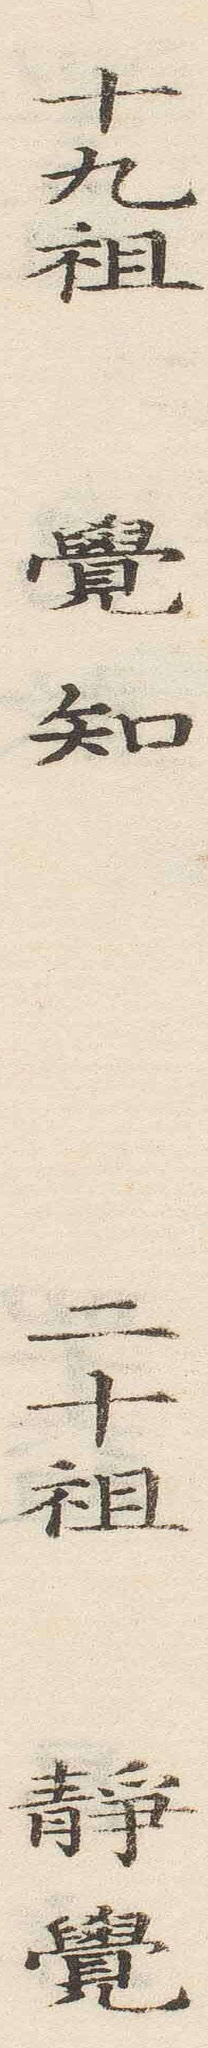十九祖覺知二十祖靜覺
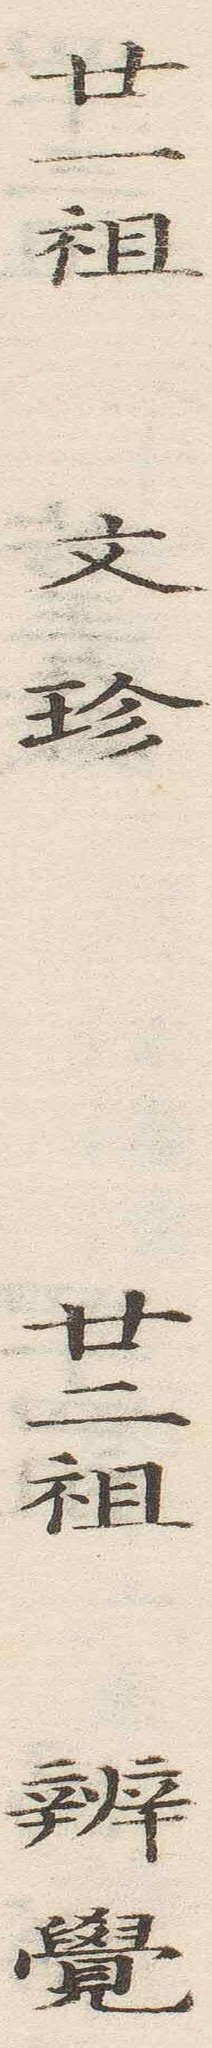廿一祖文珍廿二祖辨覺
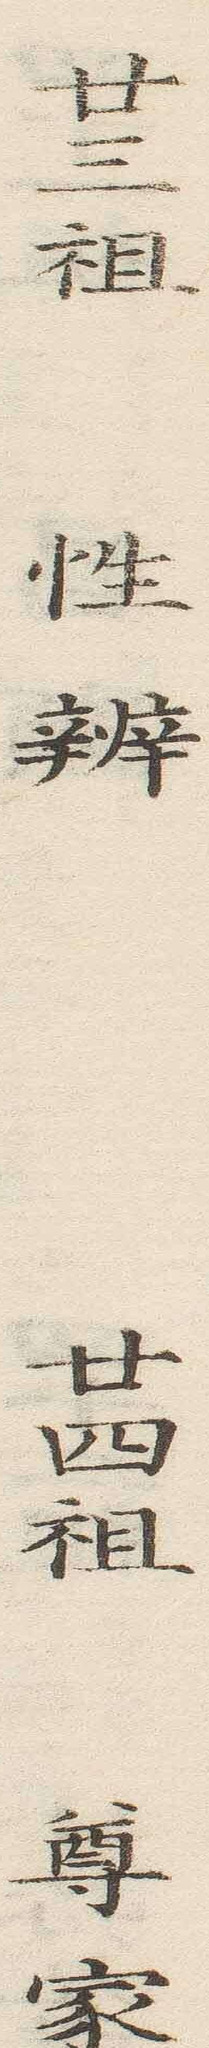廿三祖性辨廿四祖尊家
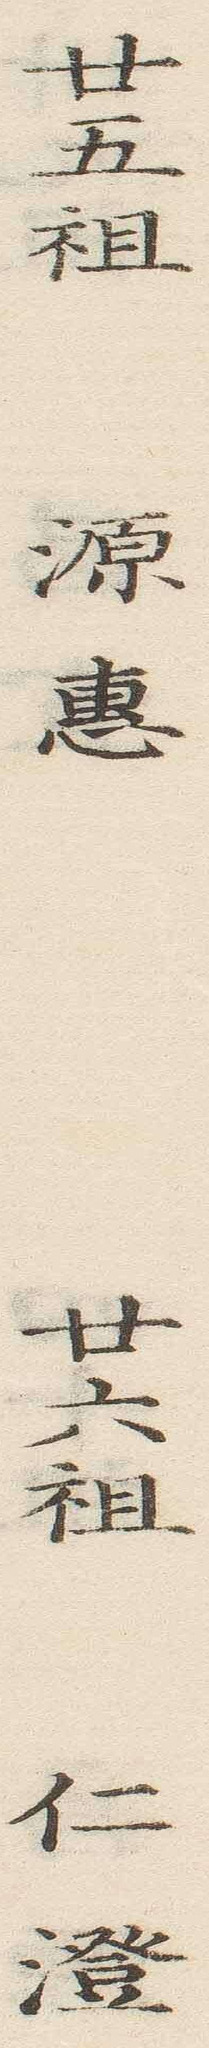廿五祖源惠廿六祖仁澄

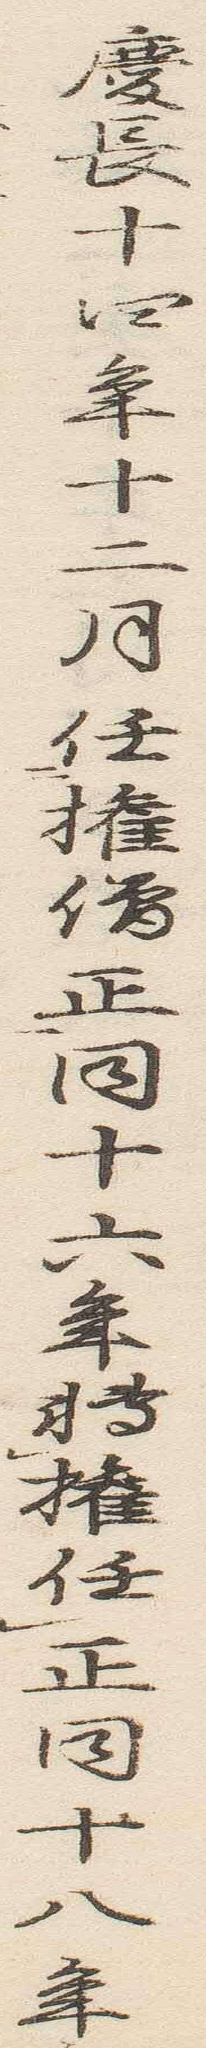慶長十四年十二月任権僧正同十六年轉権任正同十八年
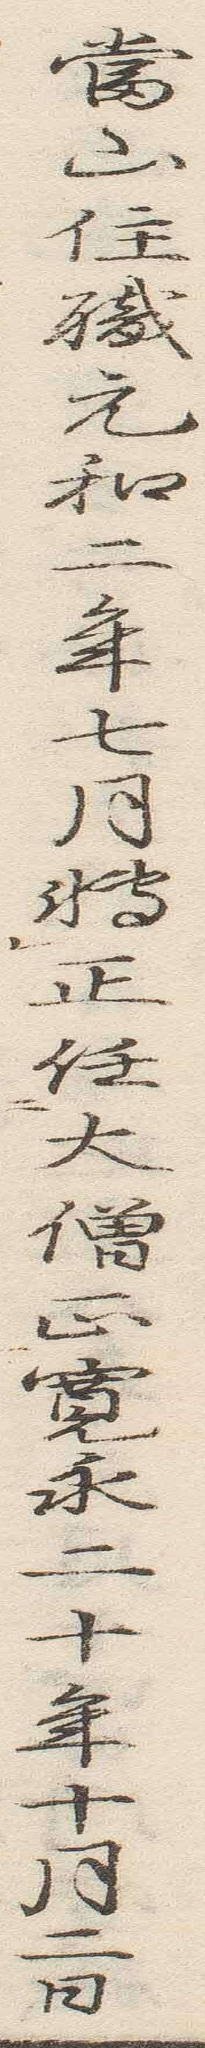當山住職元和二年七月轉正任大僧正寛永二十年十月二日
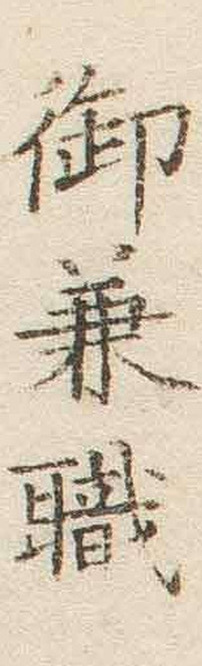御兼職
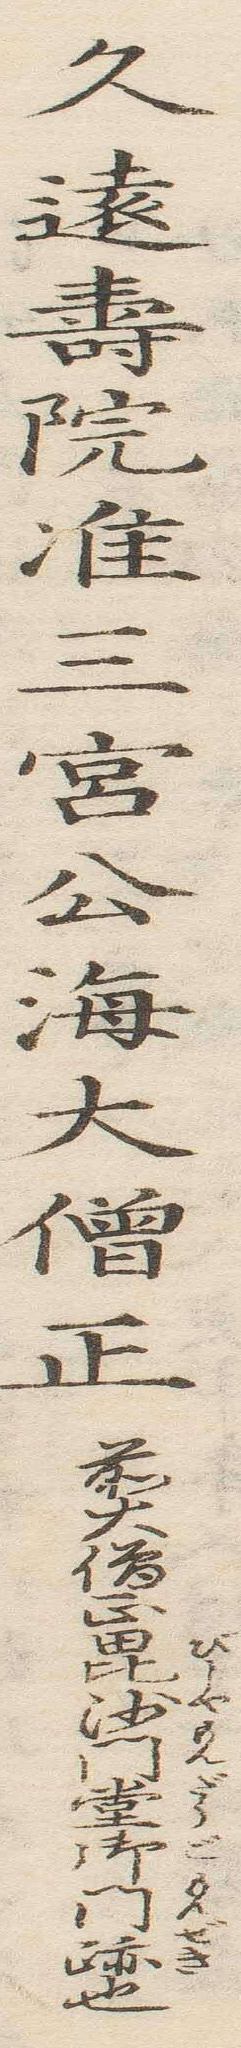久遠壽院准三宮公海大僧正前大僧正毘沙門堂御門跡也
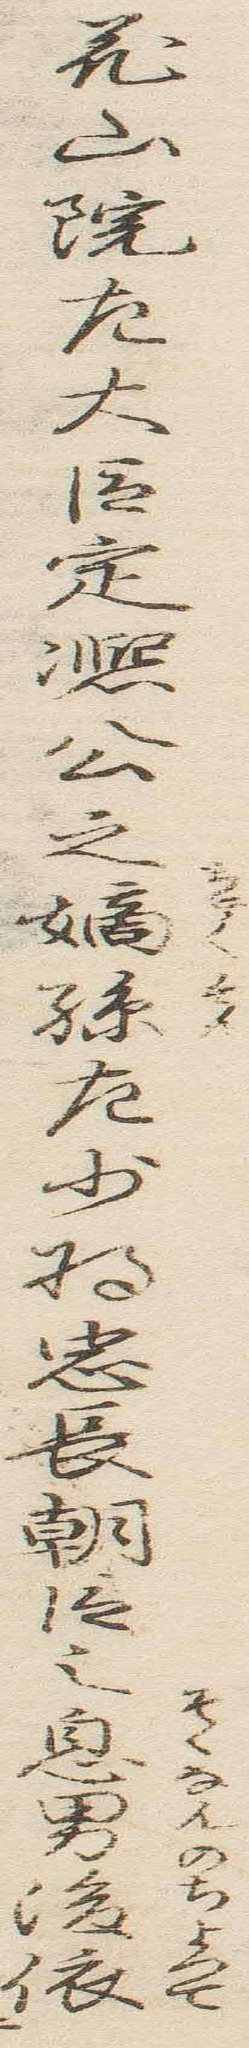花山院左大臣定凞公之嫡孫左少将忠長朝臣之息男後依
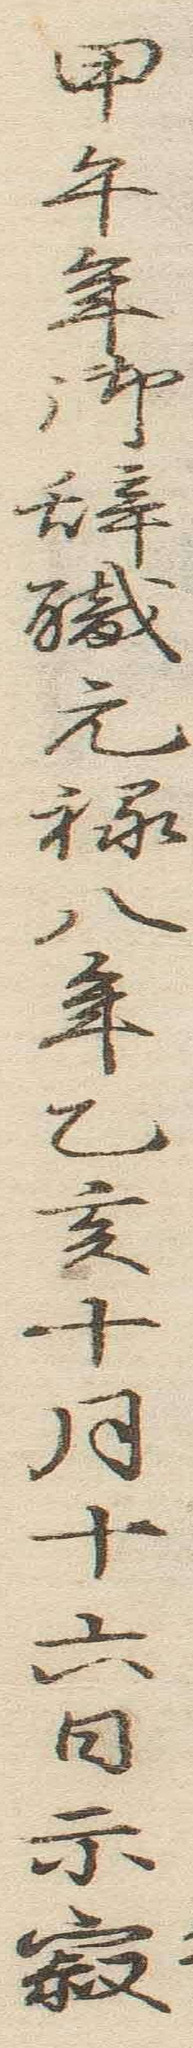甲午年御辞職元禄八年乙亥十月十六日示寂

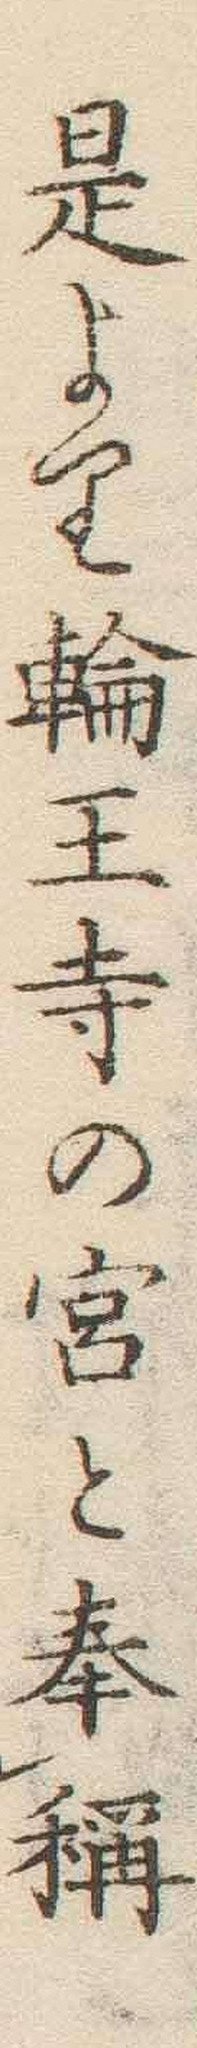是より輪王寺の宮と奉稱
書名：日光山志
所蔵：東京学芸大学附属図書館 国文学研究資料館
